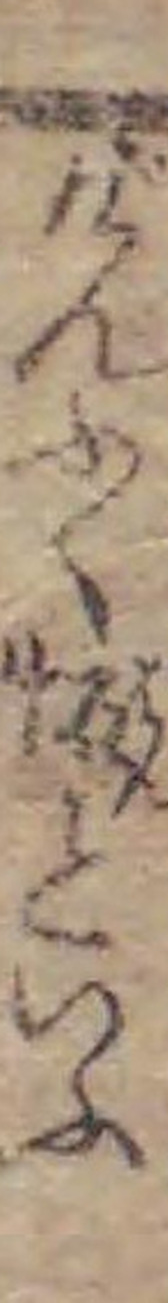げんふく坂といふ
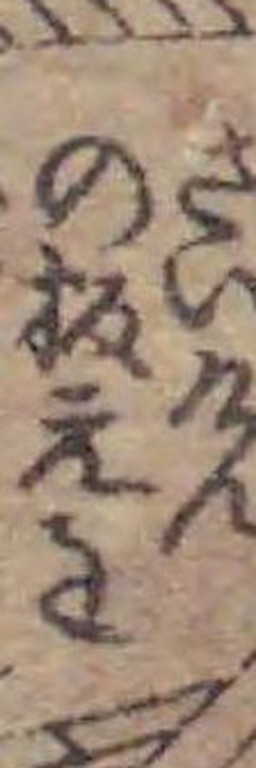の板元を
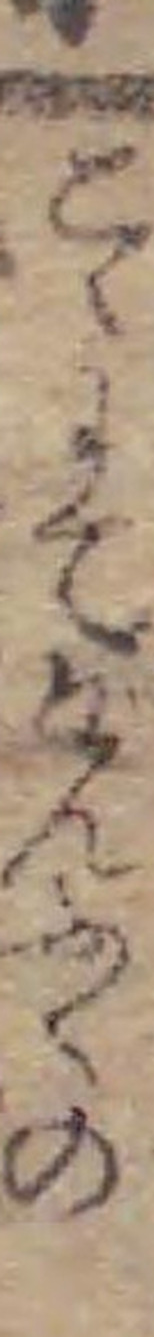こゝにてげんふくの
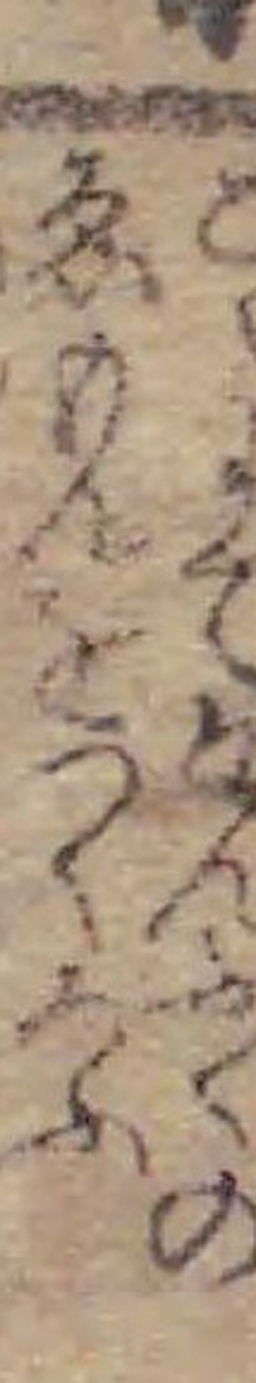ゑもんをつくろふ
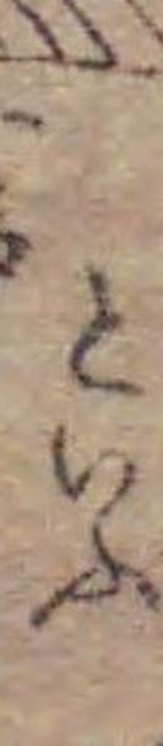といふ
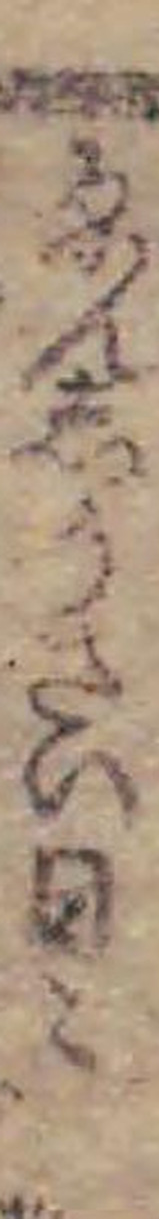ゑんしうさい日々
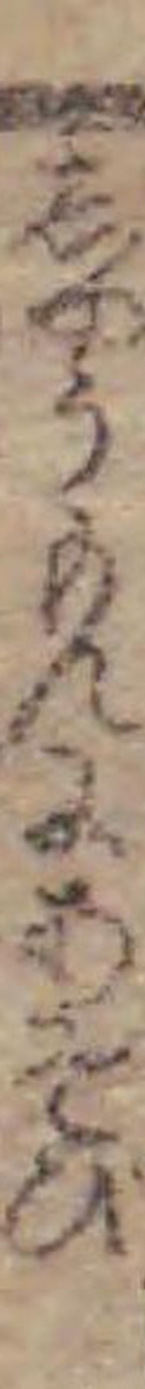しやうもんにあそび
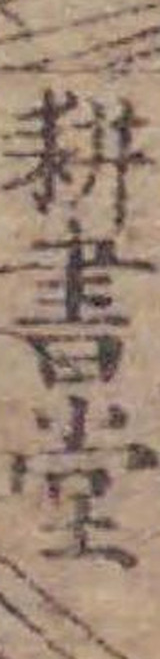耕書堂
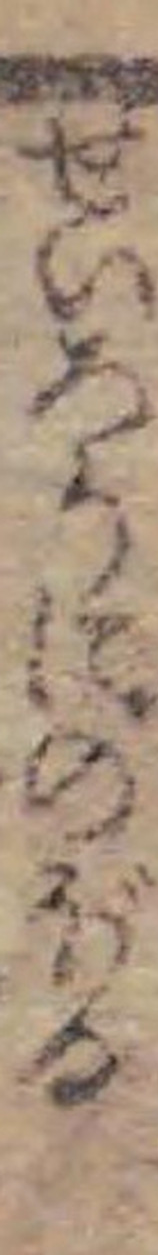せいろうにのぼる
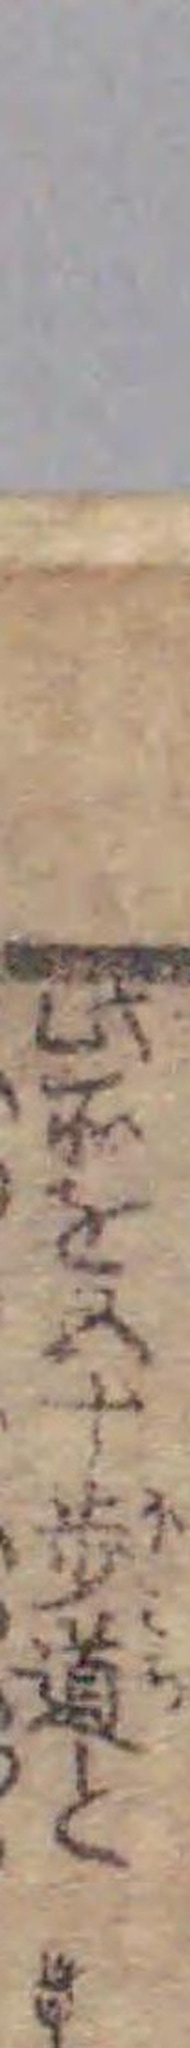此所を五十歩道と
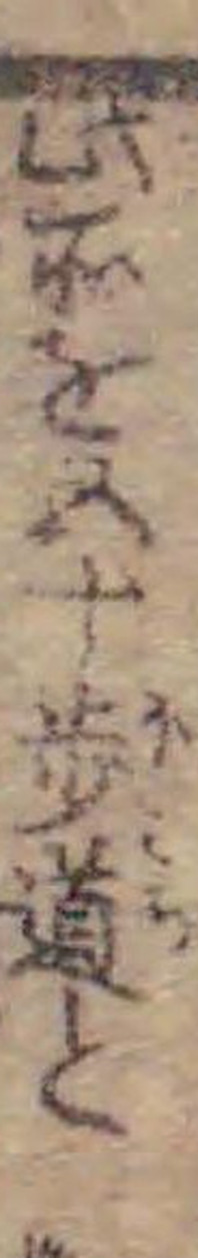此所を五十歩道と
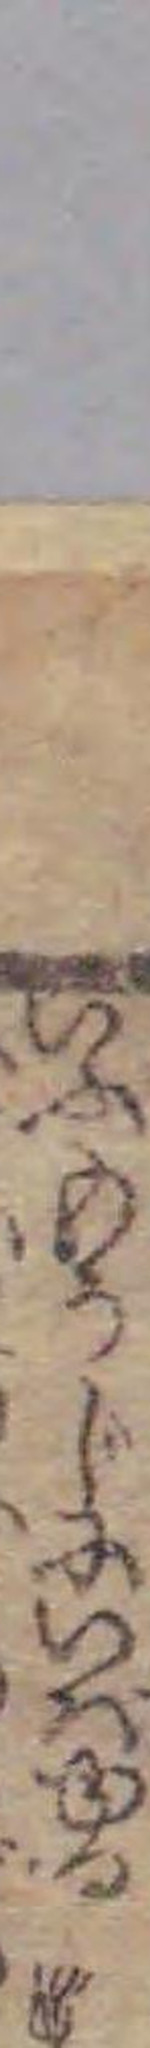いふもうじにいはゆる
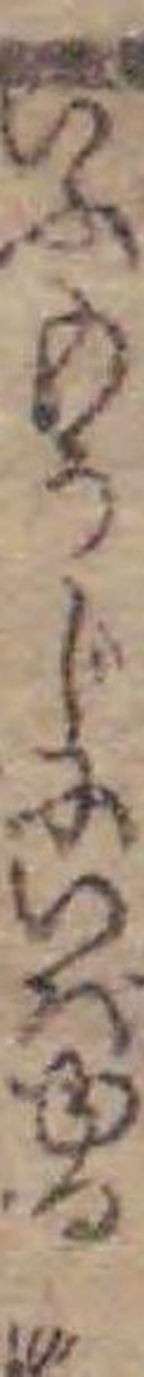いふもうじにいはゆる
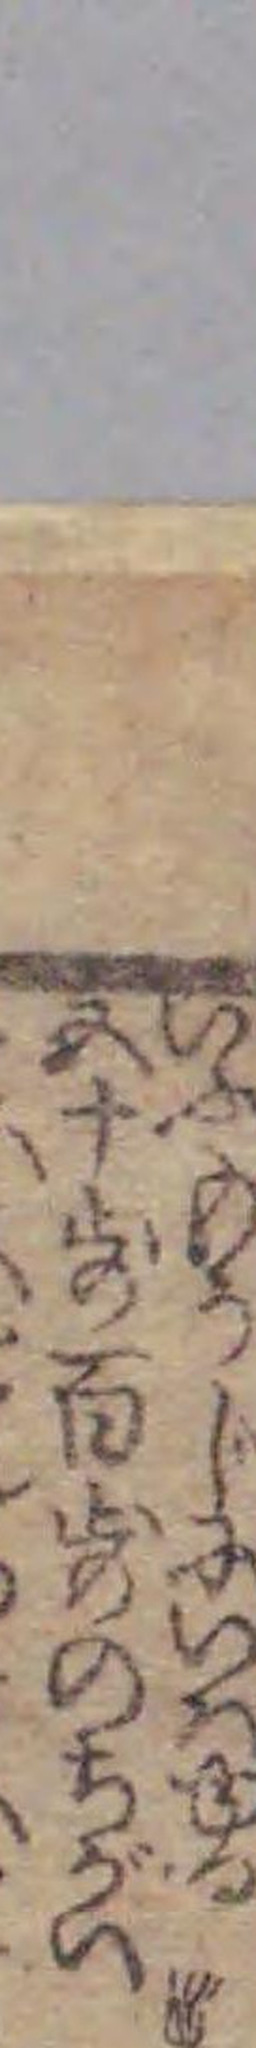五十歩百歩のちがい
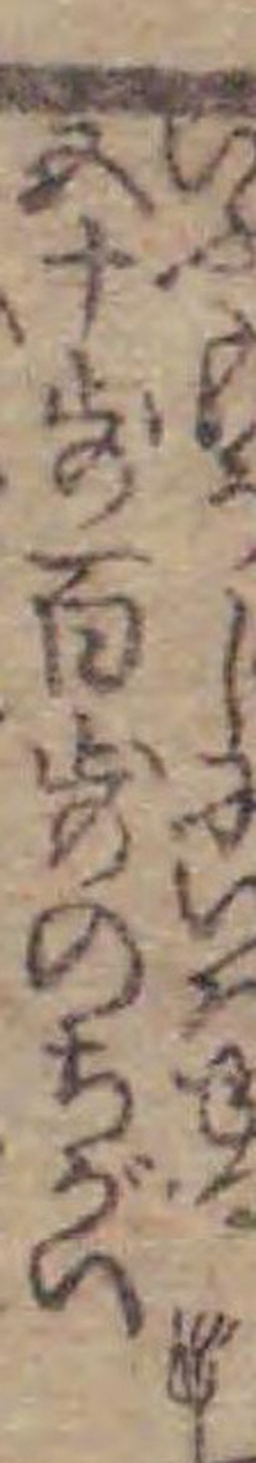五十歩百歩のちがい
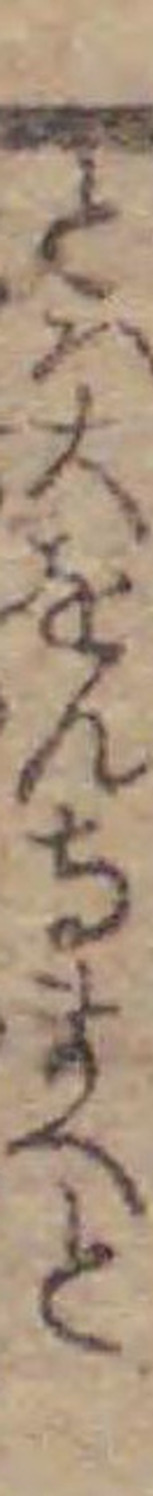とは大をん寺まへと
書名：此奴和日本 : 2巻
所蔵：国立国会図書館 National Diet Library, JAPAN
